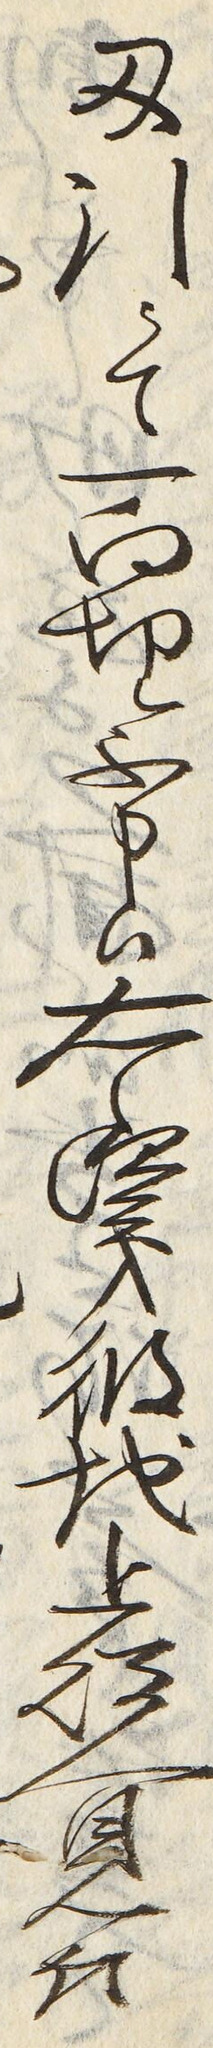刃引ニて一向切ㇾ不申候右次第彼地上役人見付
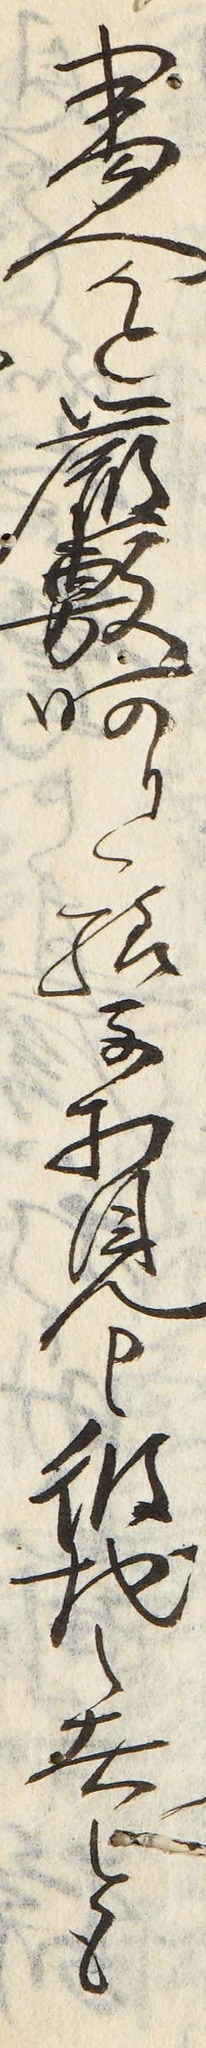番人を厳敷呵り候様子相見申彼地之者とも
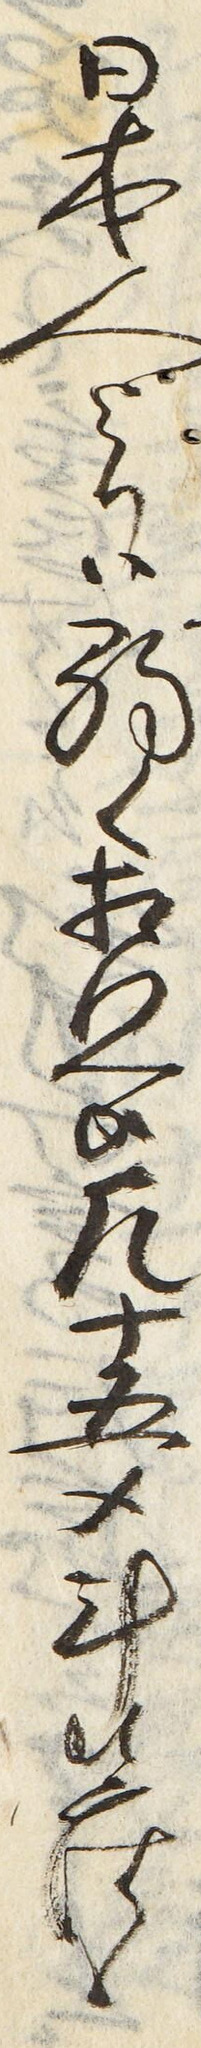日本人よりは弱く相見候凡十五メ計御座候

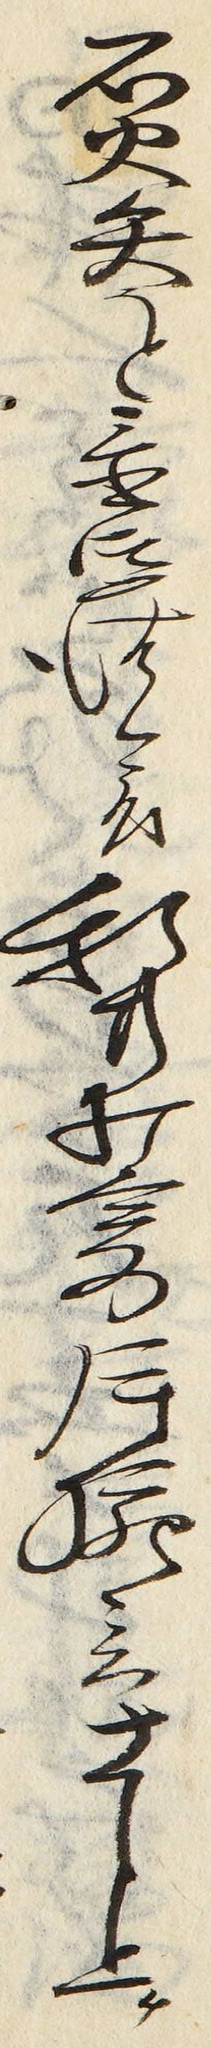石火矢を置御座候ニ付私共打寄片腕ニ而さし上ケ
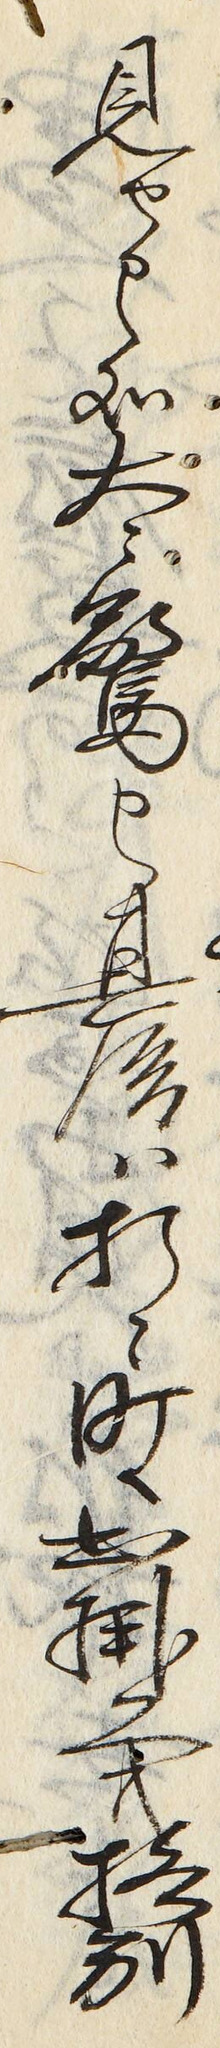見セ申候処大ニ驚申候其後は折々町へ出掛候へ共格別
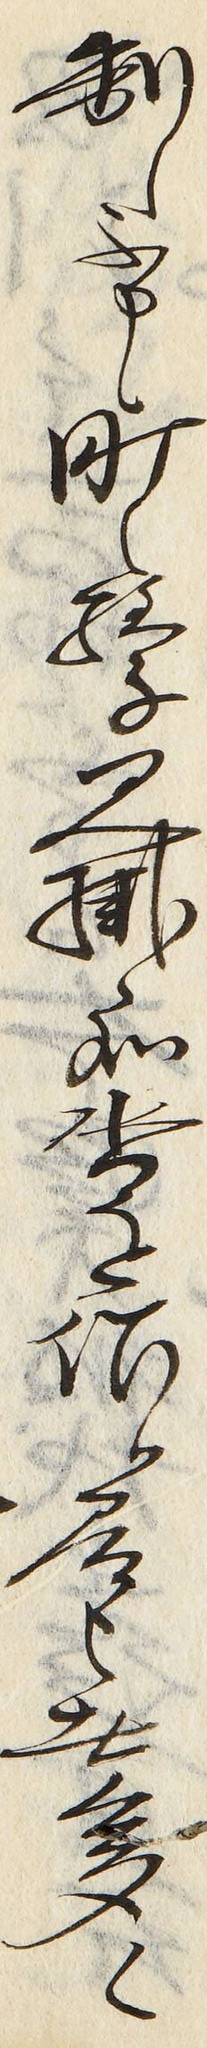制し不申候町之様子見掛候処沓を作り居申候者多く
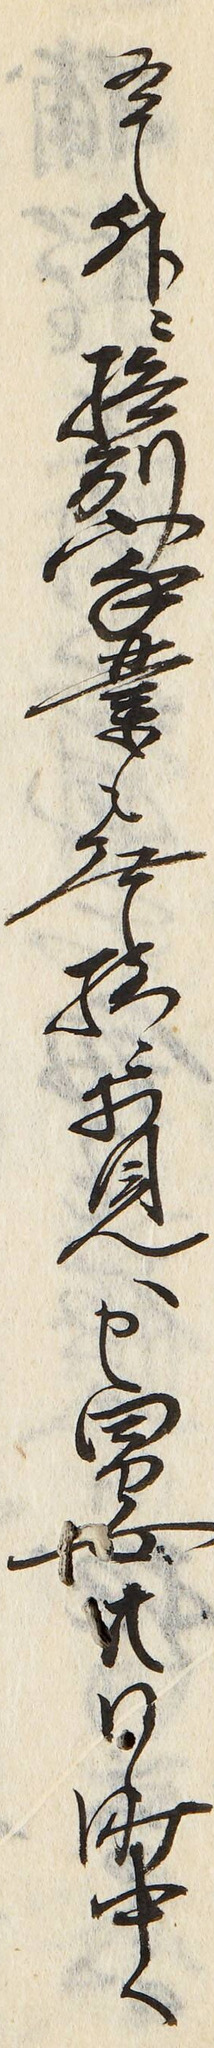右之外ニ格別家業も無之様ニ相見へ申候男女共日々町中へ
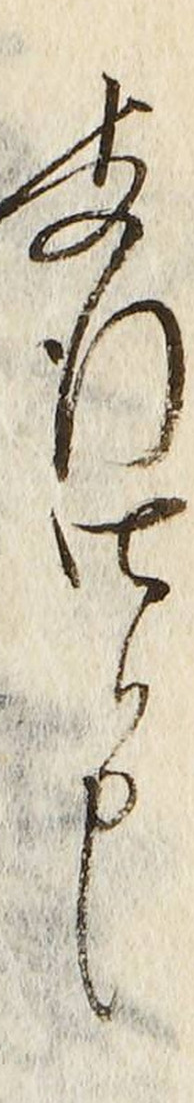歩行仕り申候
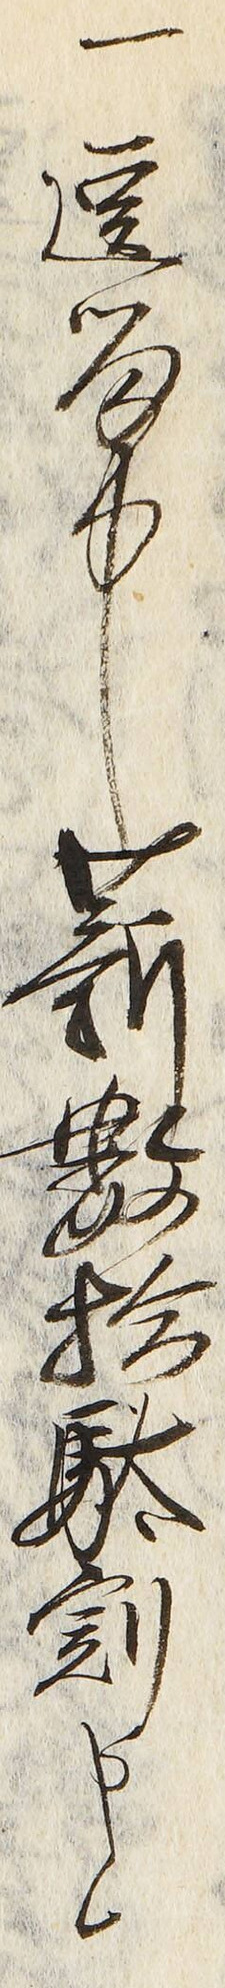一逗留中薪数拾駄割申候
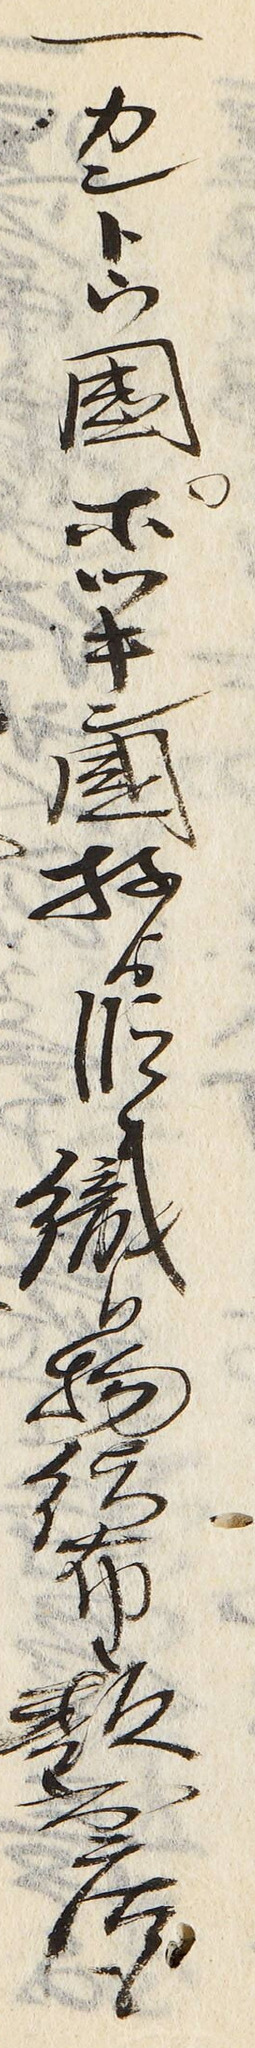一カントウ国ホツキン国抔ゟ段々織り物綿布類出店も
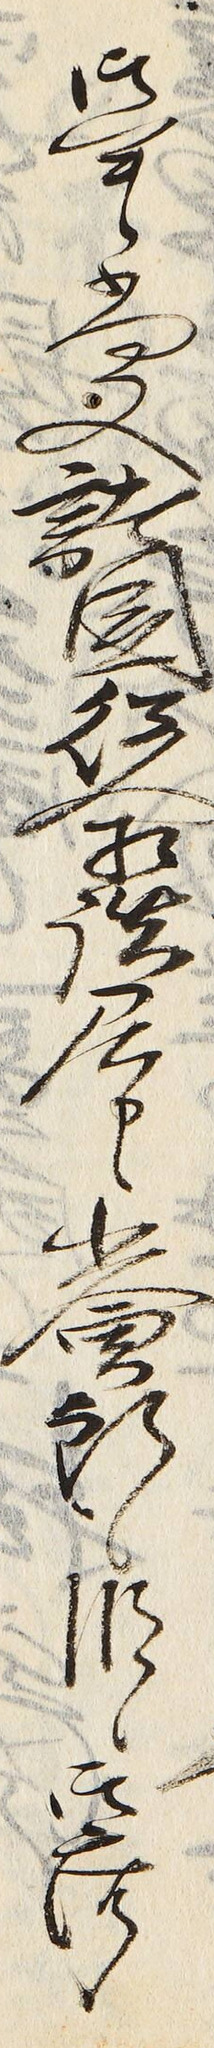御坐候尚又諸国役人相談居申候出会所も段々御座候
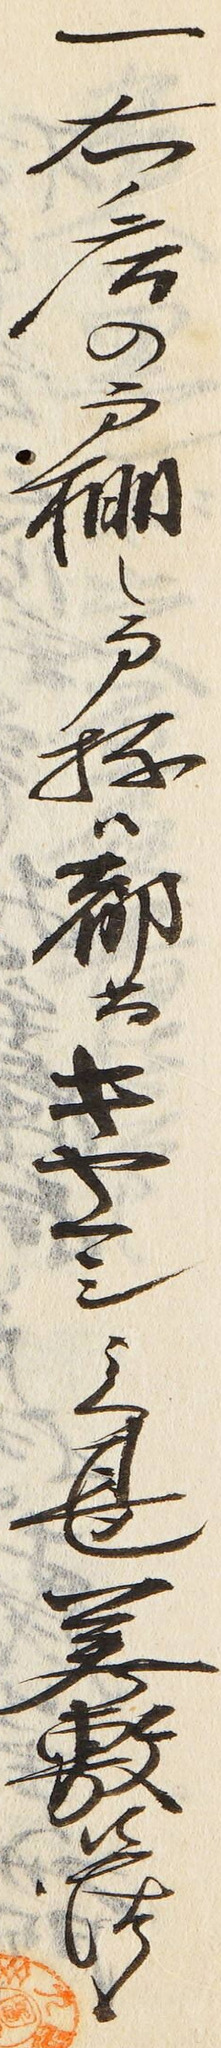一右店の戸棚之戸抔は都而キヤマンニ而甚美敷御座候
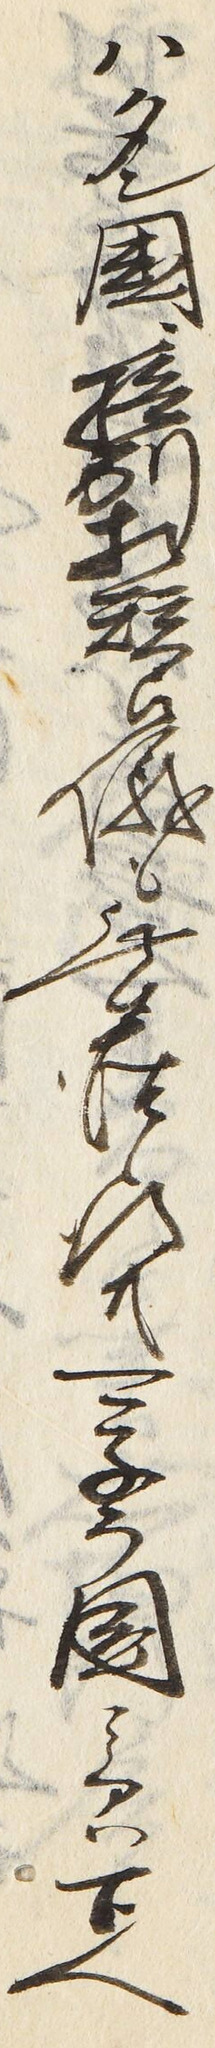ハタン国に格別相替候儀も無御座候得共マネラ国ニ而は下人
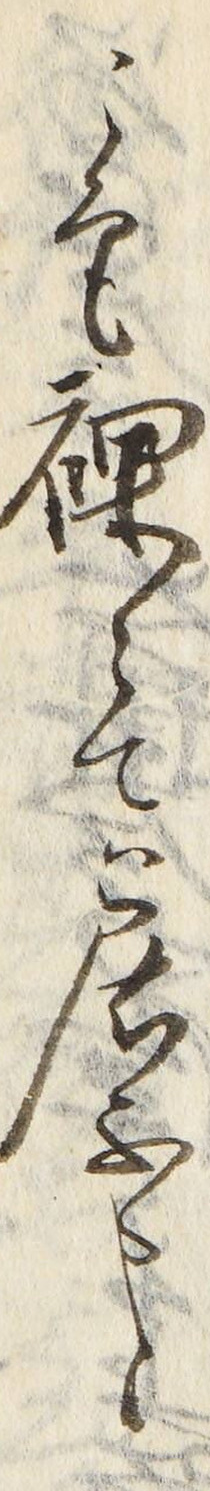ニ而も裸にては居不申候
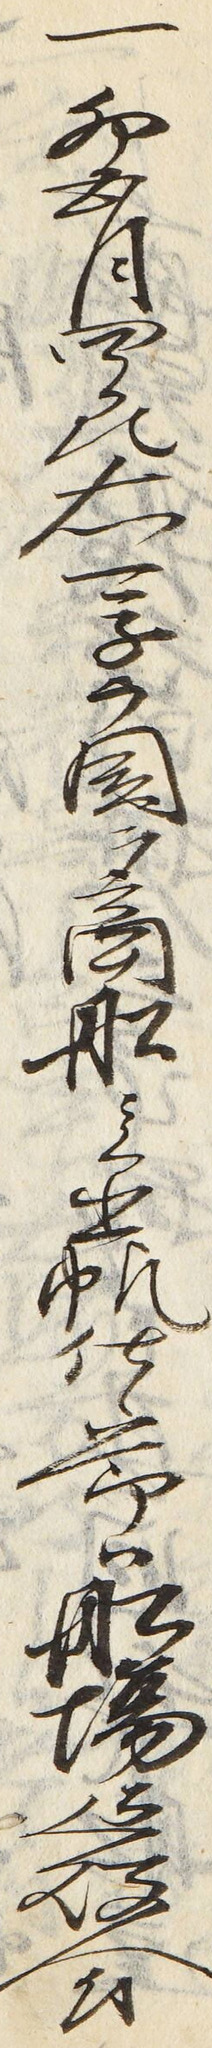一卯五月四日頃右マネラ国ヲ商船ニ而出航仕候節は船場迄役人付
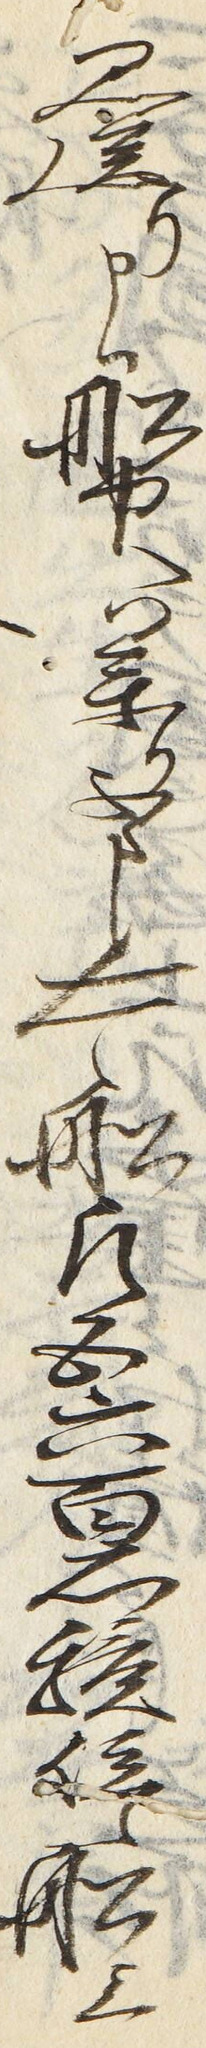見送り申候船中へは参り不申候右之船凡五六百石積位之船ニ而
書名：漂流記
